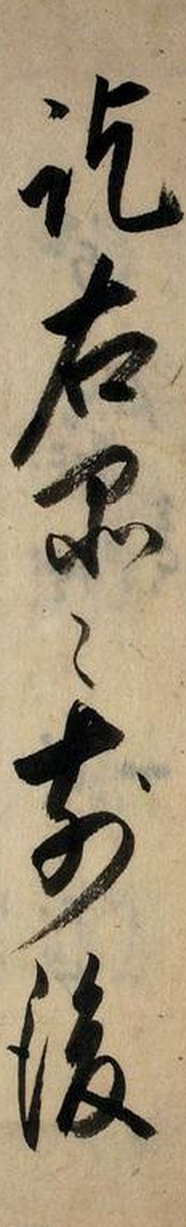訖右品々前後
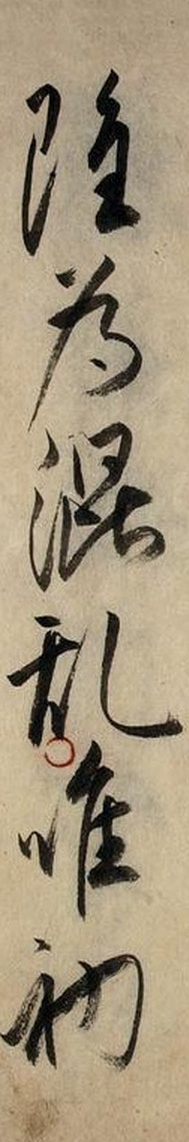雖爲混乱唯初
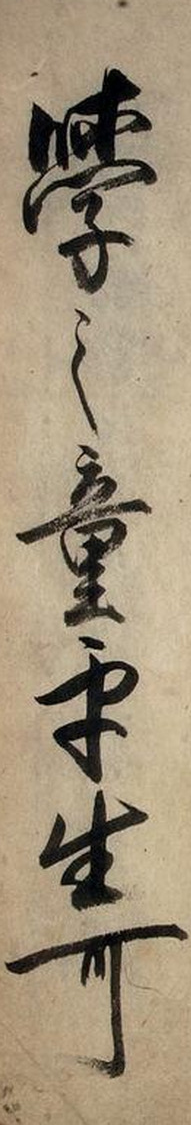学之童平生可

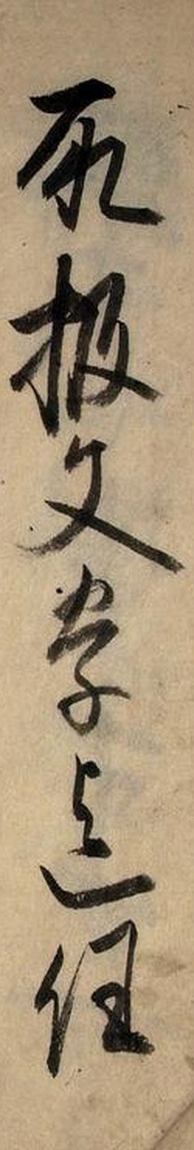取扱文字迄任
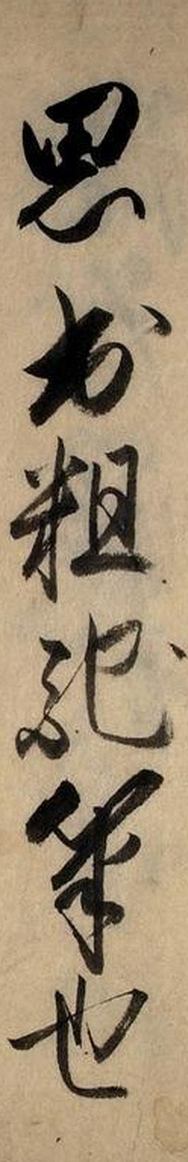思出粗馳筆也
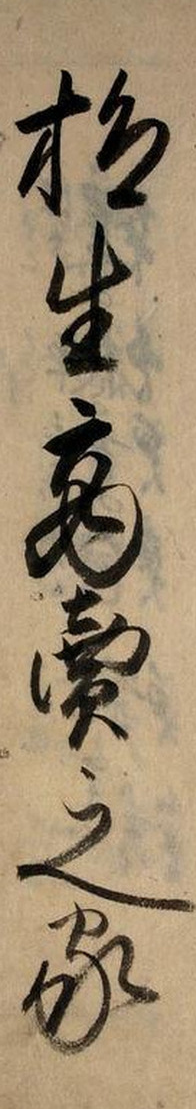抑生商売之家
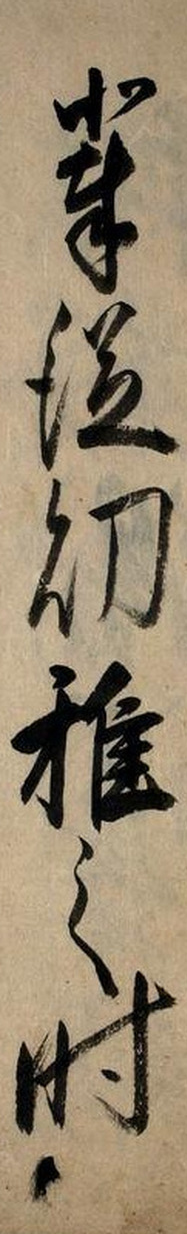輩従幼稚之時
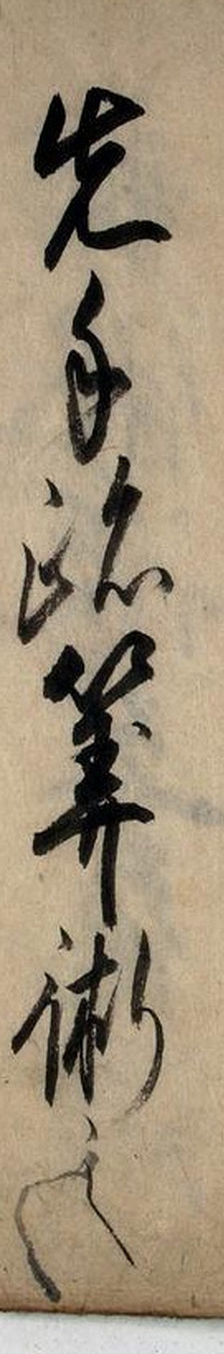先手跡算術之
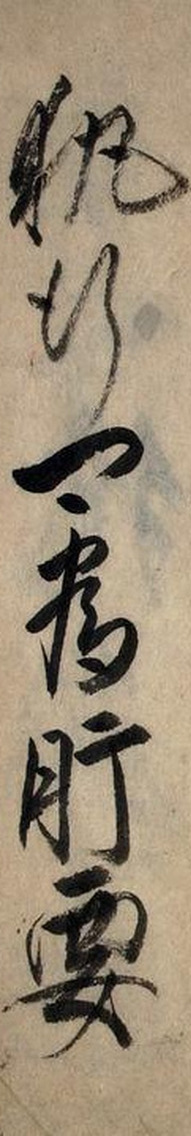執行可為肝要

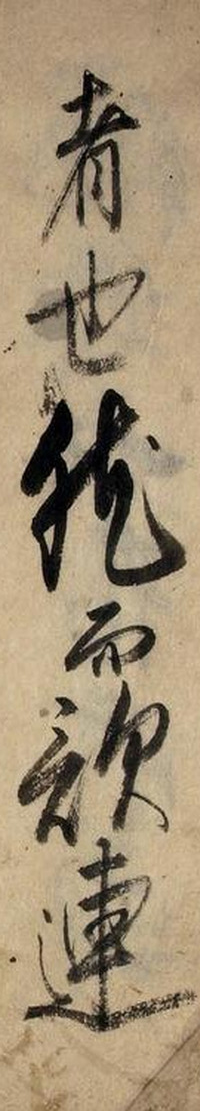者也然而歌連
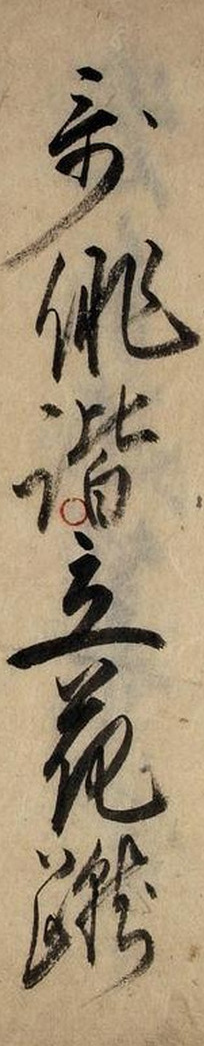哥俳諧立花蹴
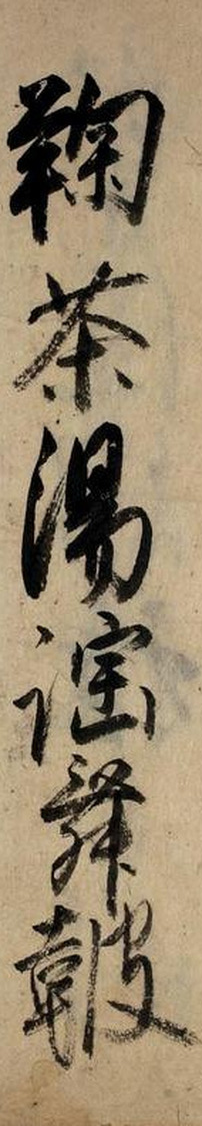鞠茶湯謡舞鼓
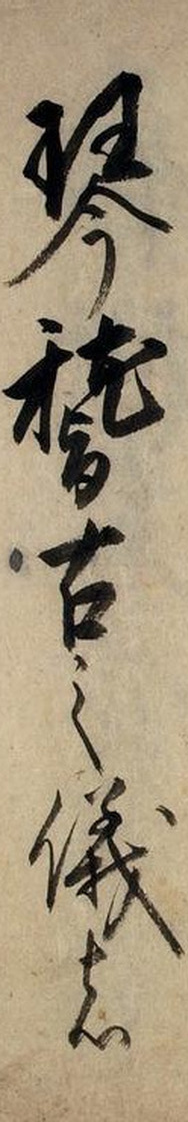琴稽古之儀者
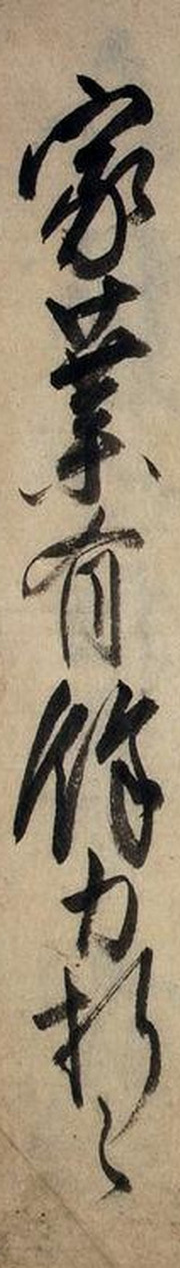家業有余力折々

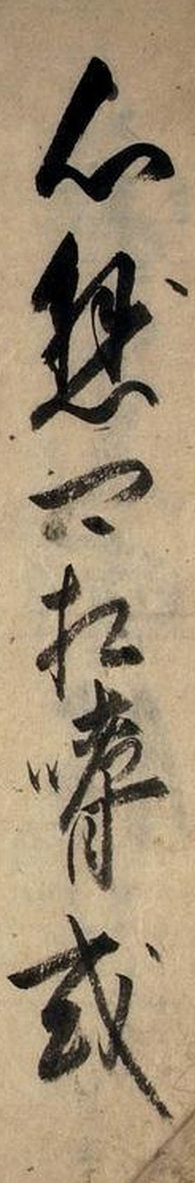心愁可相嗜或
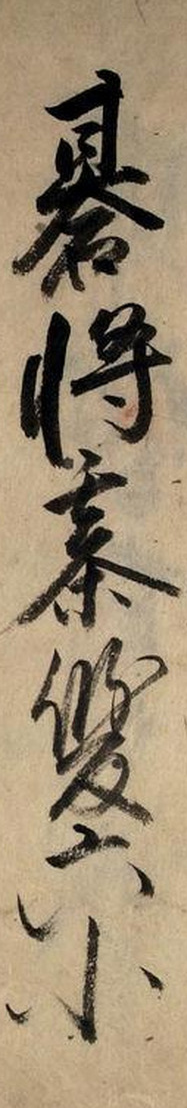碁将棋双六小
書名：商売往来（往来物、手習手本）
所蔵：福井県文書館 Fukui Prefectural Archives
